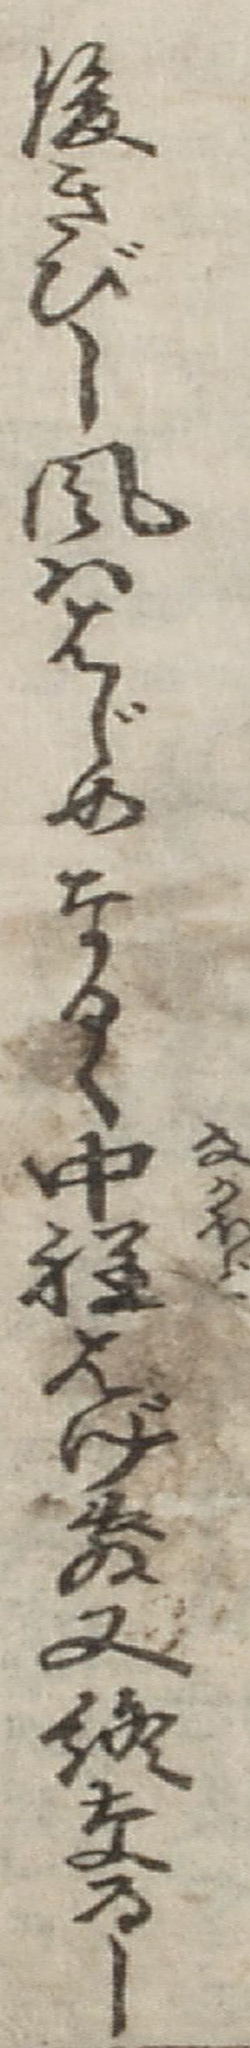後きびし風ははじめなるく中程はげ敷又終なるし
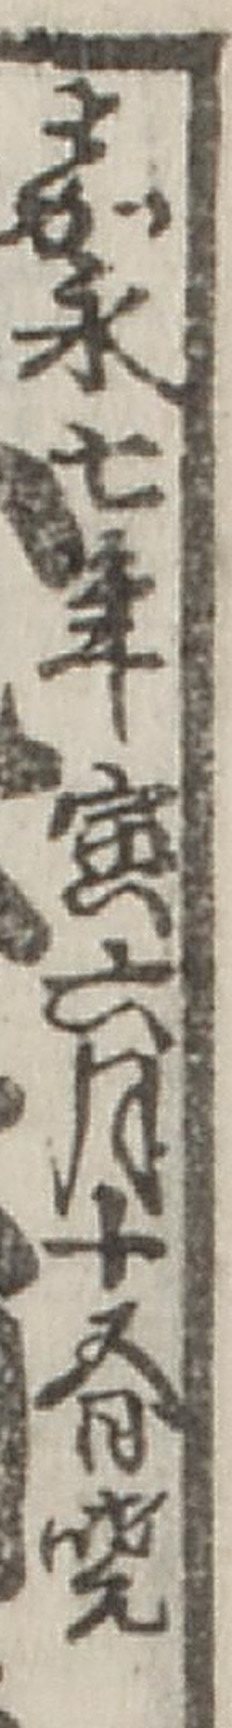嘉永七年寅六月十五日暁
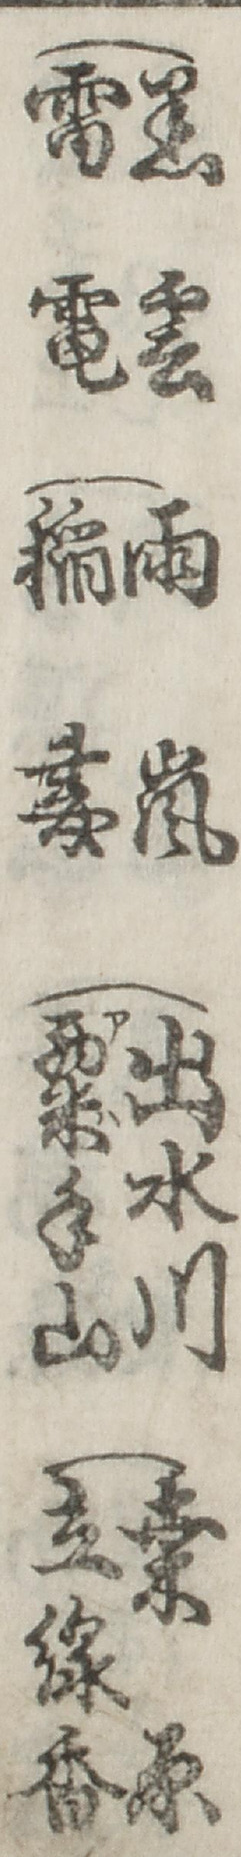雷電稲妻粟手山立線香
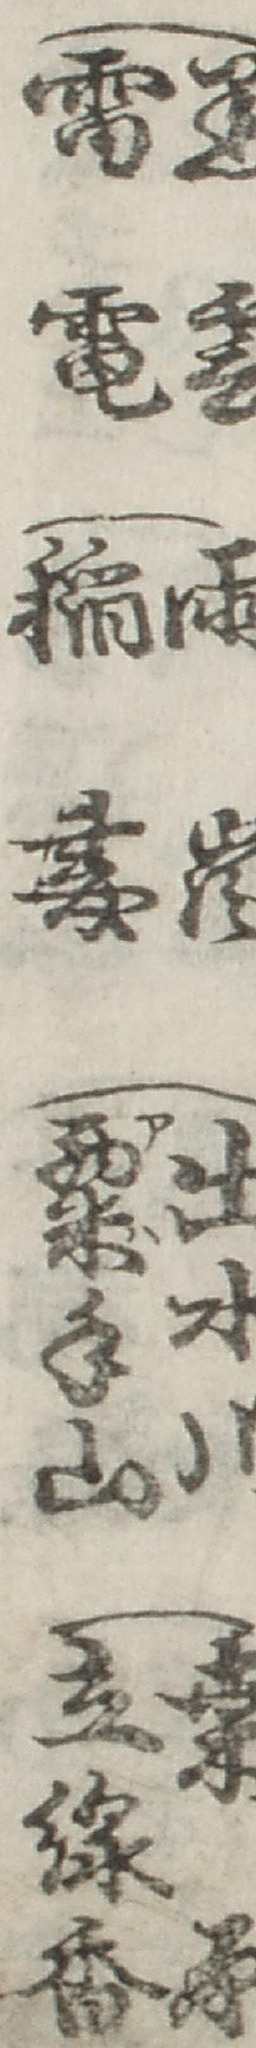雷電稲妻粟手山立線香

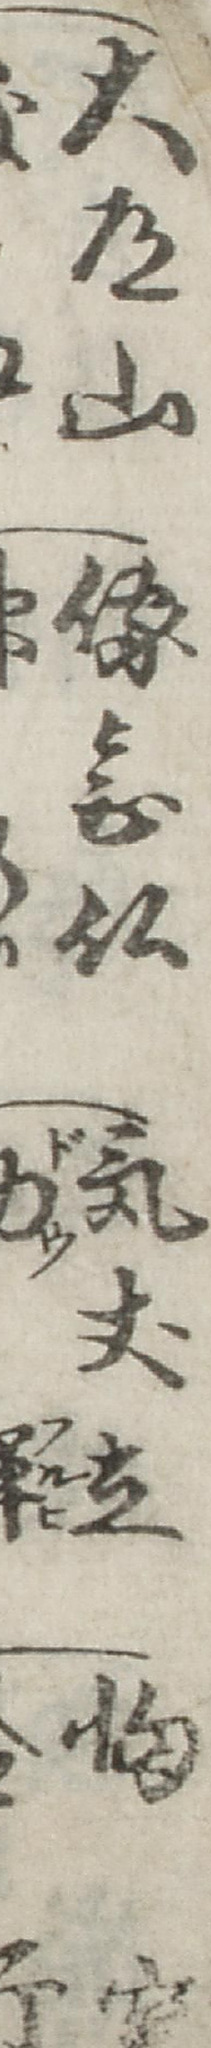大道山像念仏気丈立恟突
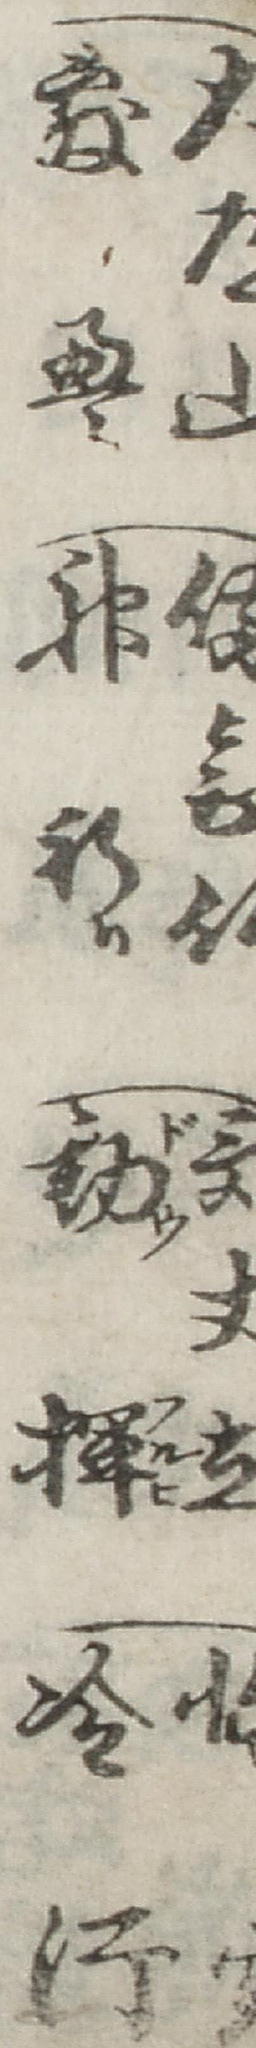敷畳神祈り動揮冷行
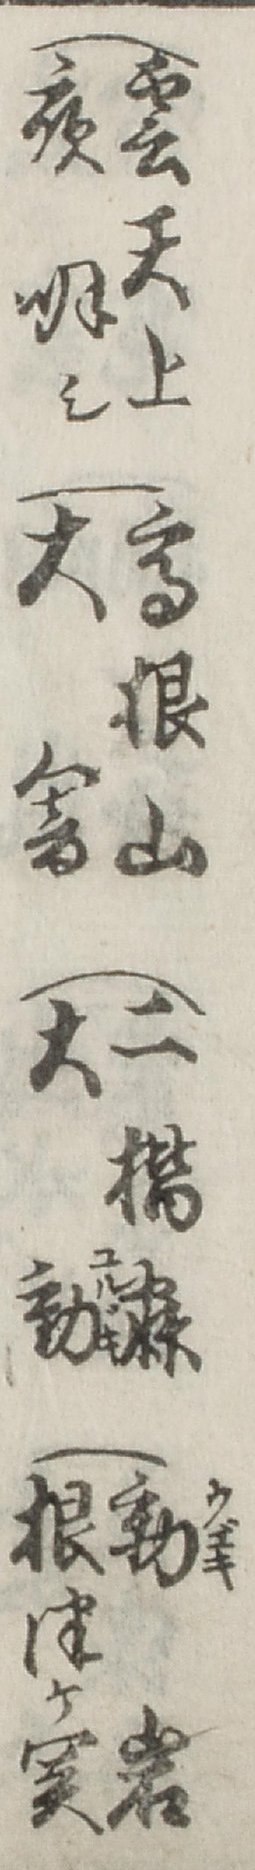雲天上高根山二階寝動岩
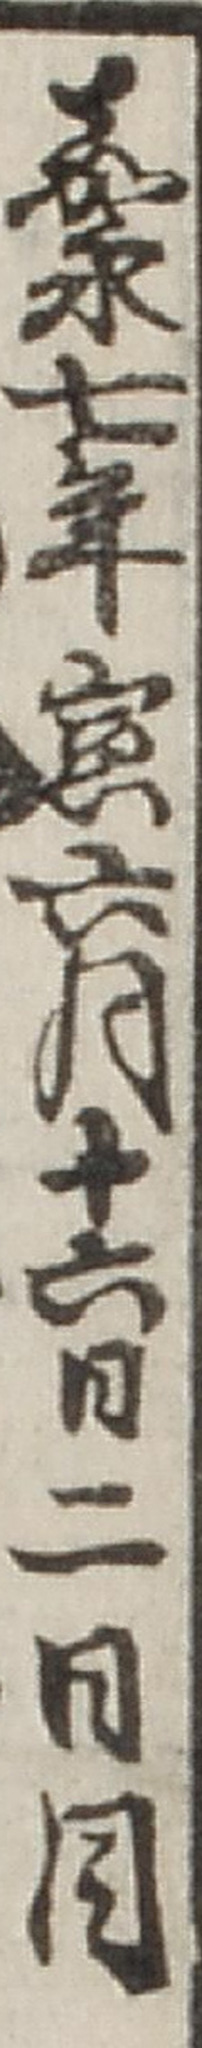嘉永七年寅六月十六日二日目
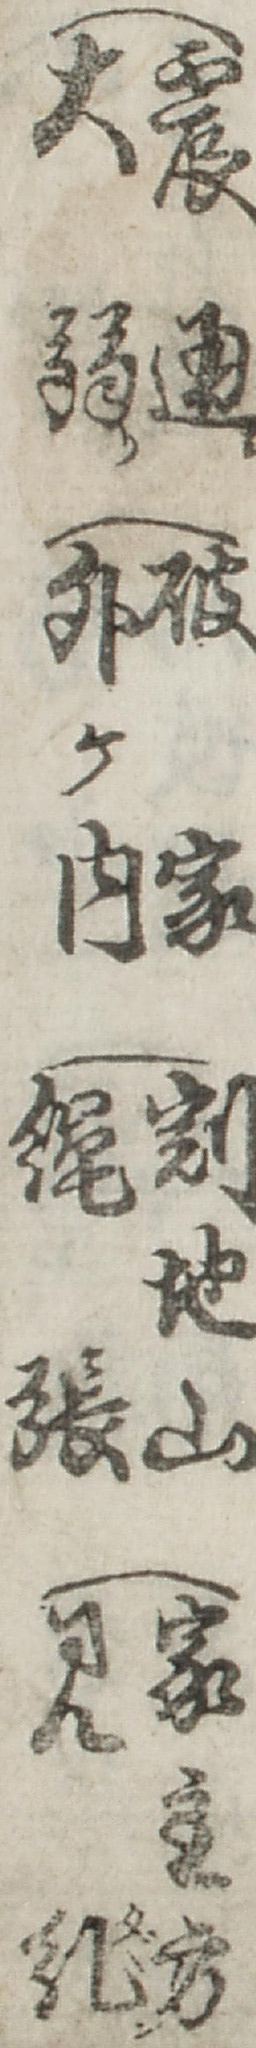大弱り外ヶ内縄張見糺

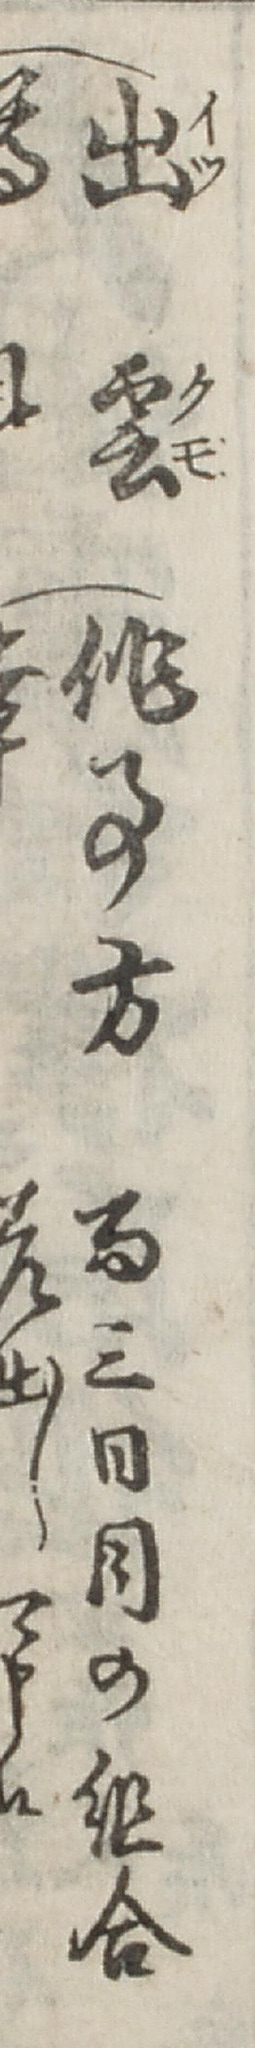出雲作事方雨三日目の組合
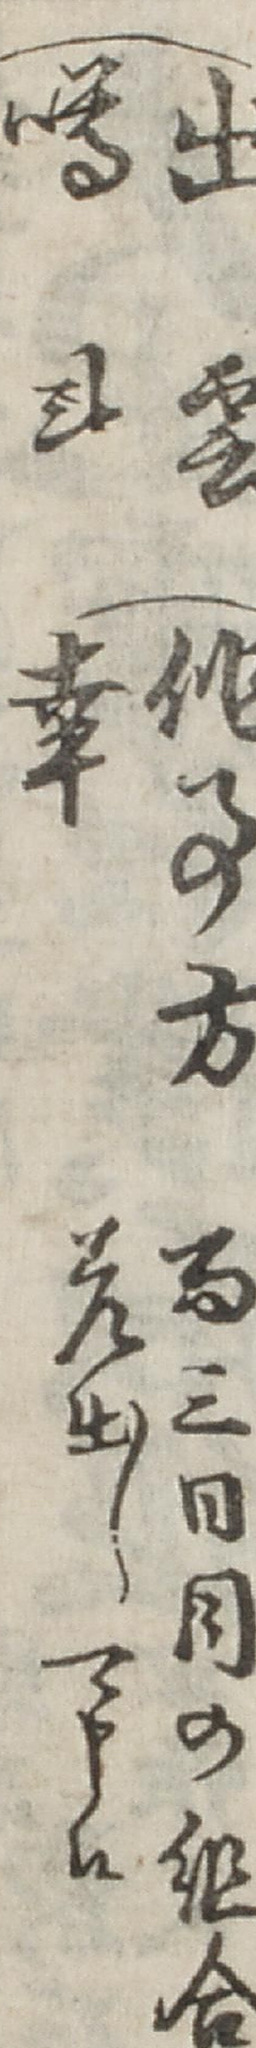噂斗幸差出し可申候
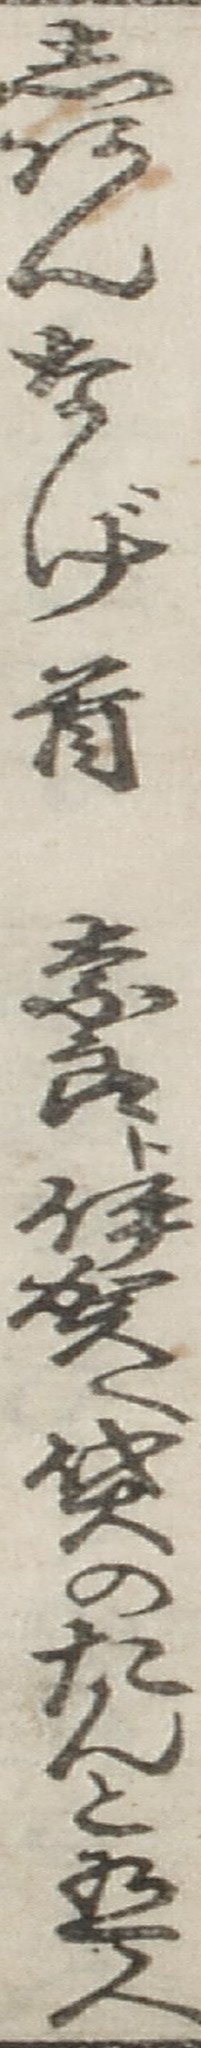しあんなげ首奈良ト伊賀へ貸のたんと有人
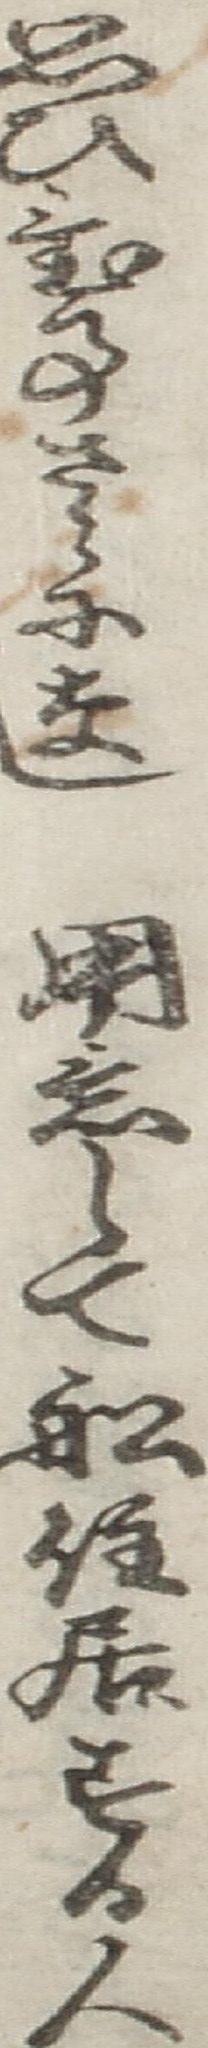思ひ置事さらになし用意して船住居する人
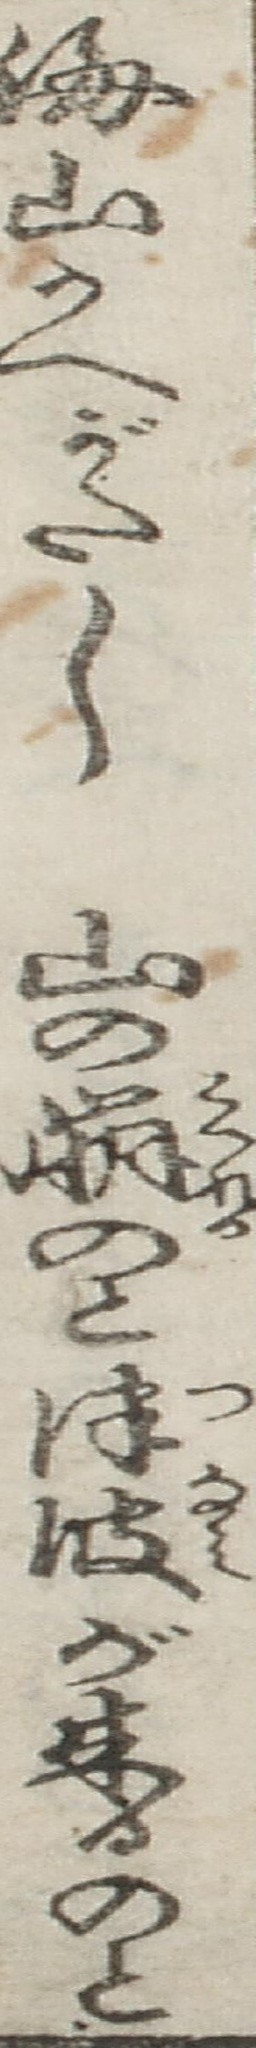海山かへがたし山の崩のと津波が来るのと
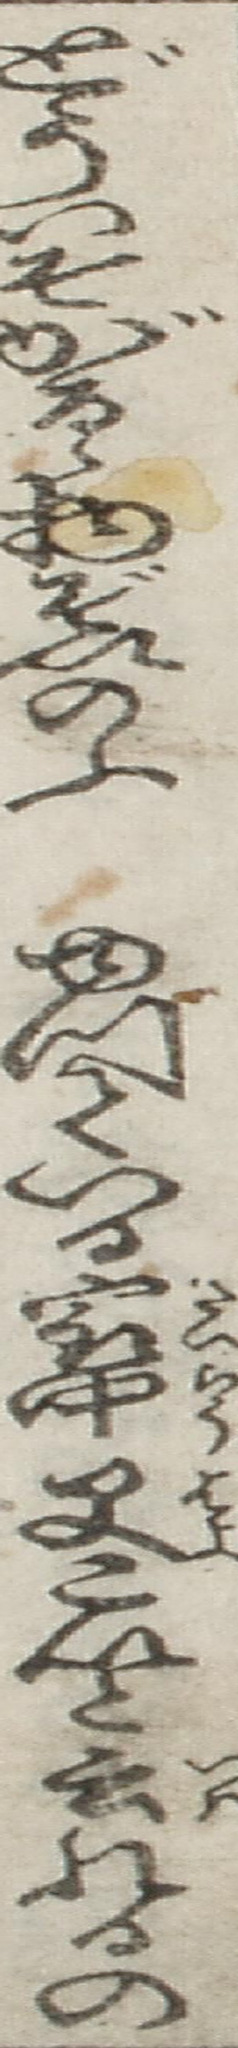どういそがるゝ物ぞいのふゆつている最中早こいと云れるの
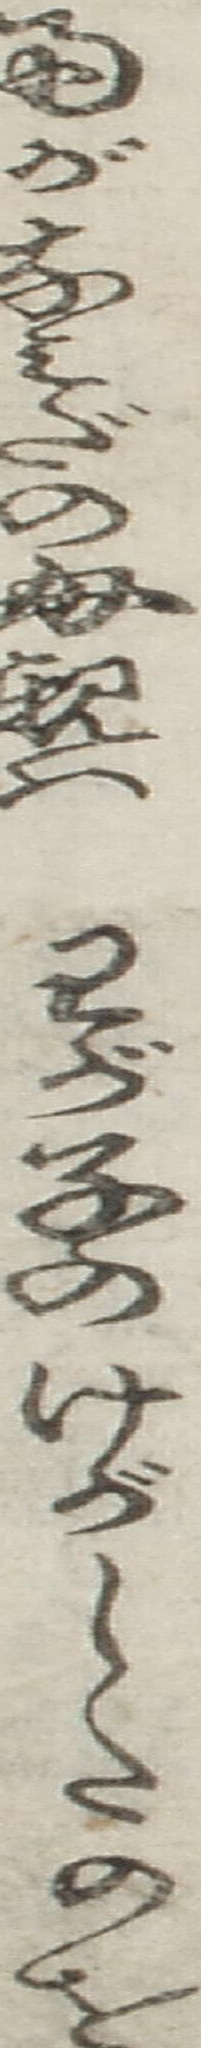雨がなみだの母親はわが子のけがしたのを
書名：地震世直草紙　全
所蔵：東京大学地震研究所図書室 Earthquake Research Institute Library, The University of Tokyo, JAPAN
